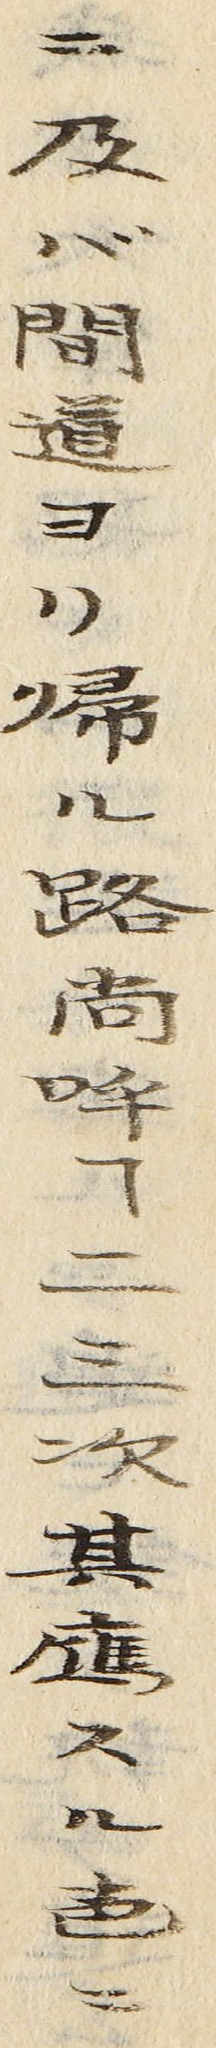ニ及バ間道ヨリ帰ル路尚呼コト二三次其応スル声ニ
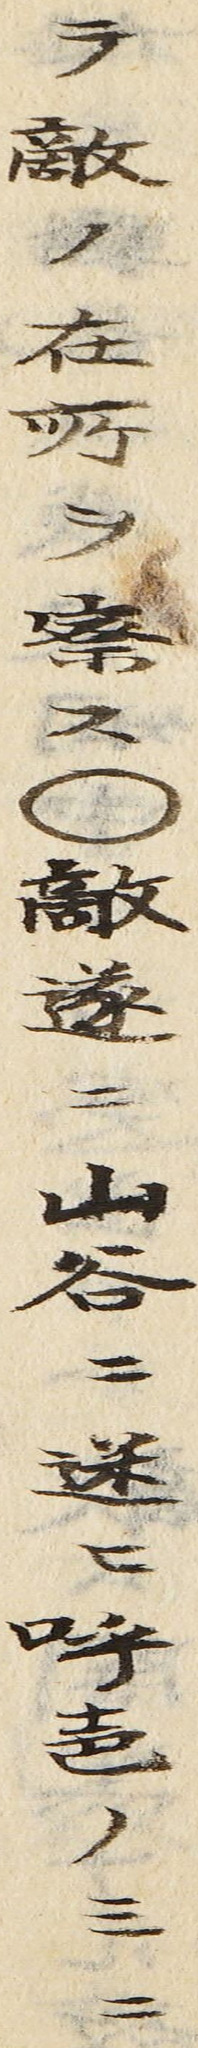テ敵ノ在所ヲ察ス◯敵遂ニ山谷ニ迷ヒ呼声ノミニ
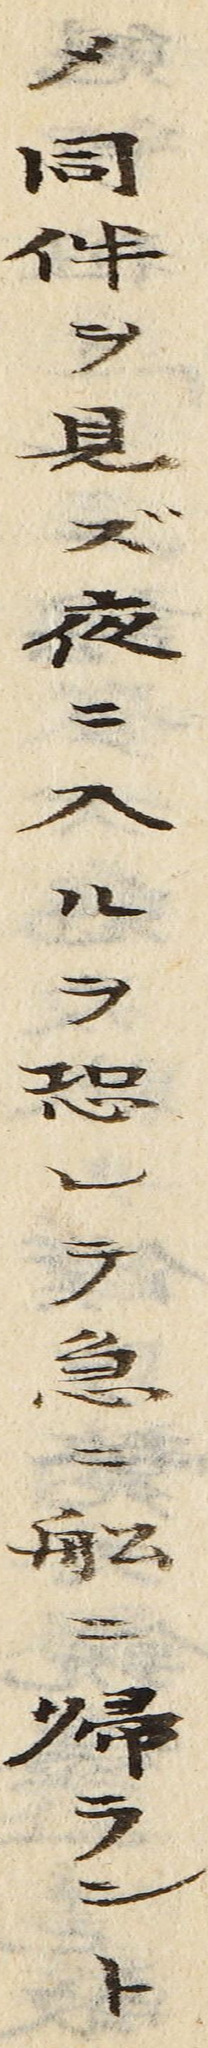シテ同伴ヲ見ズ夜ニ入ルヲ恐レテ急ニ船ニ帰ラント
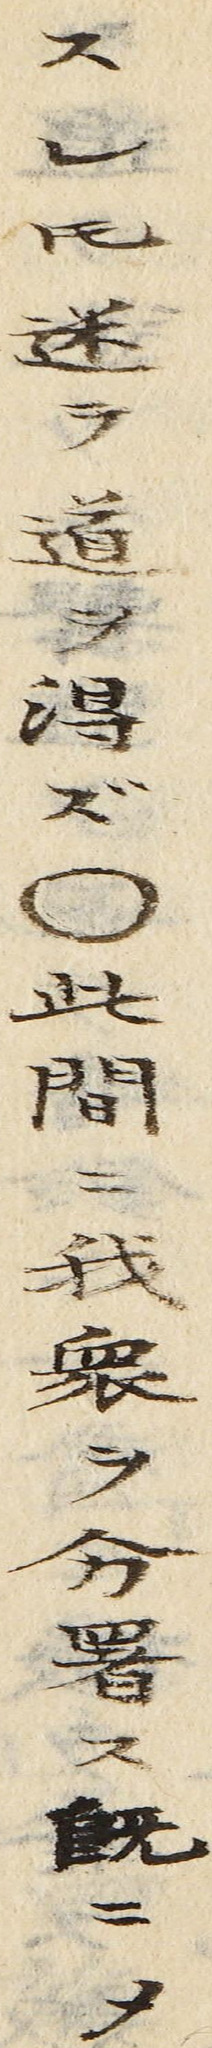スレトモ迷テ道ヲ得ズ◯此間ニ我衆ヲ分署ス既ニシテ
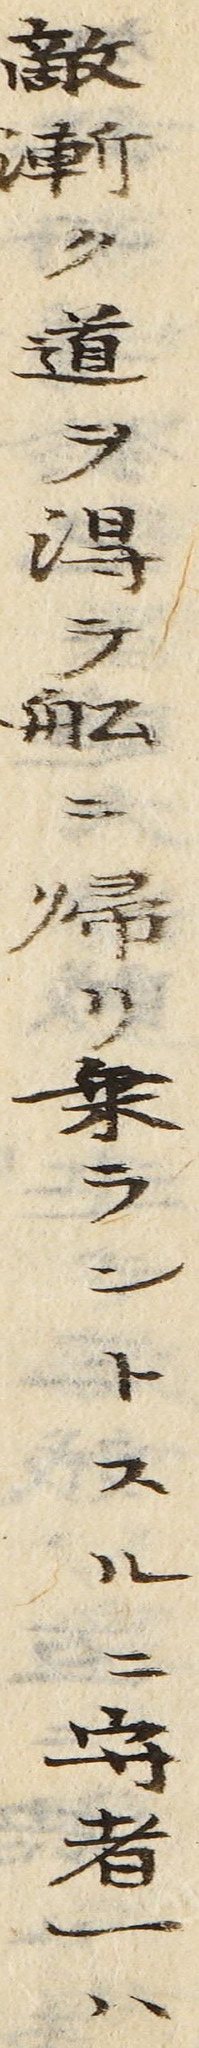敵漸ク道ヲ得テ船ニ帰リ乗ラントスルニ守者一ハ
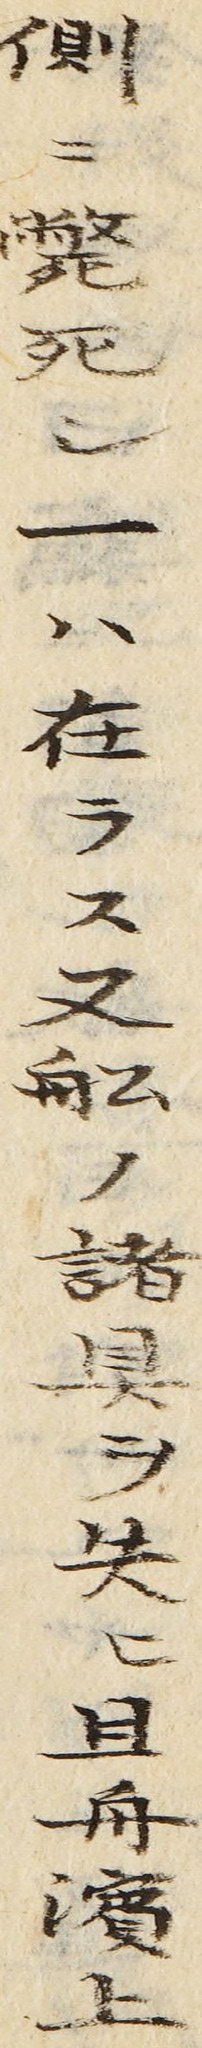側ニ斃死シ一ハ在ラス又船ノ諸具ヲ失ヒ且舟浜上
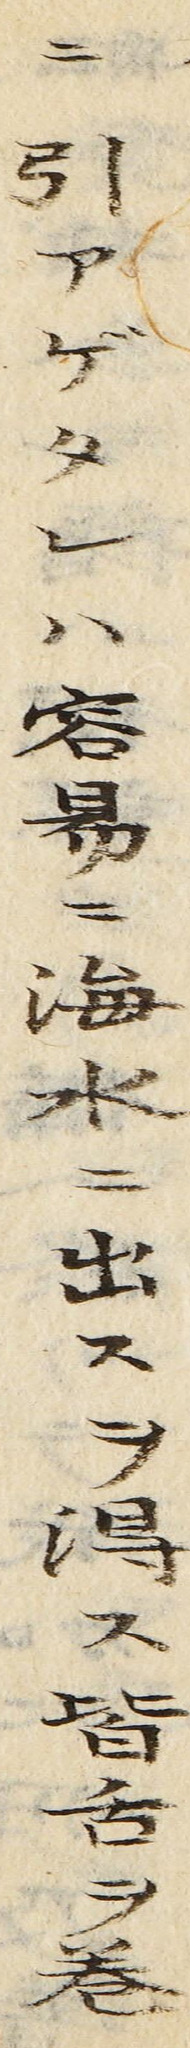ニ引アゲタレハ容易ニ海水ニ出スヲ得ス皆舌ヲ巻
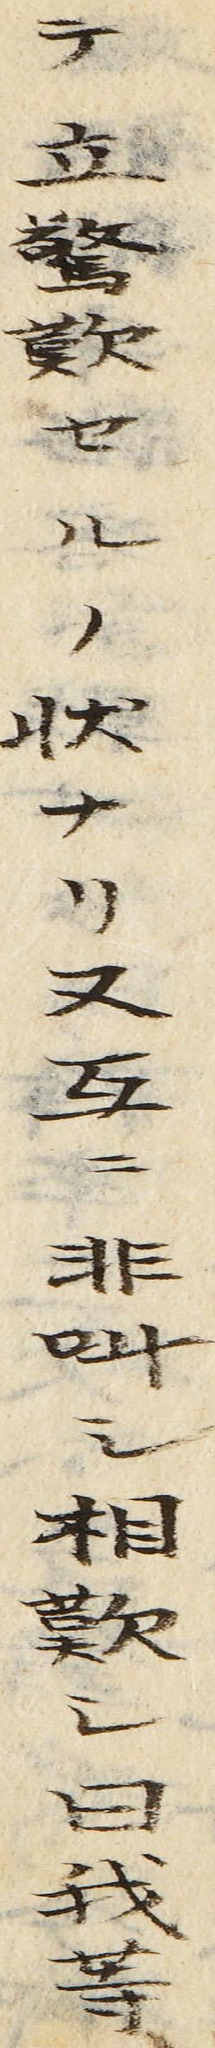テ立驚歎セルノ状ナリ又互ニ非叫シ相歎シ曰我等
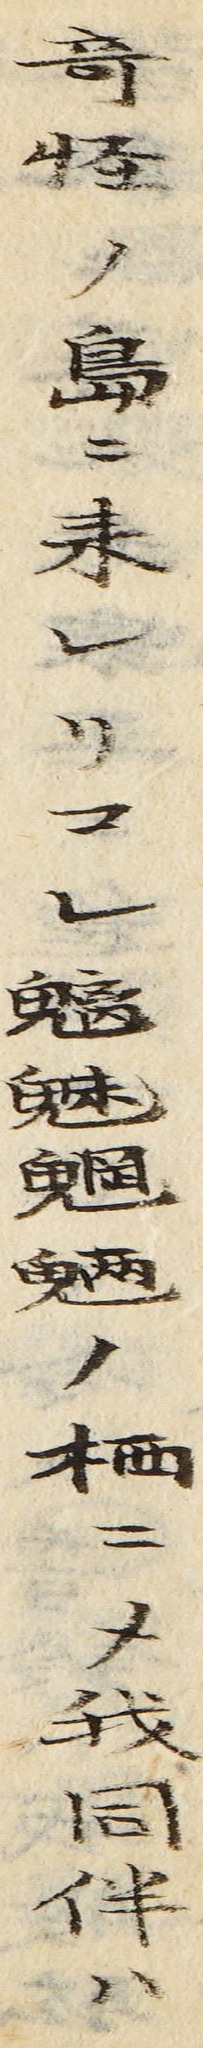奇怪ノ島ニ来レリコレ魑魅魍魎ノ栖ニシテ我同伴ハ
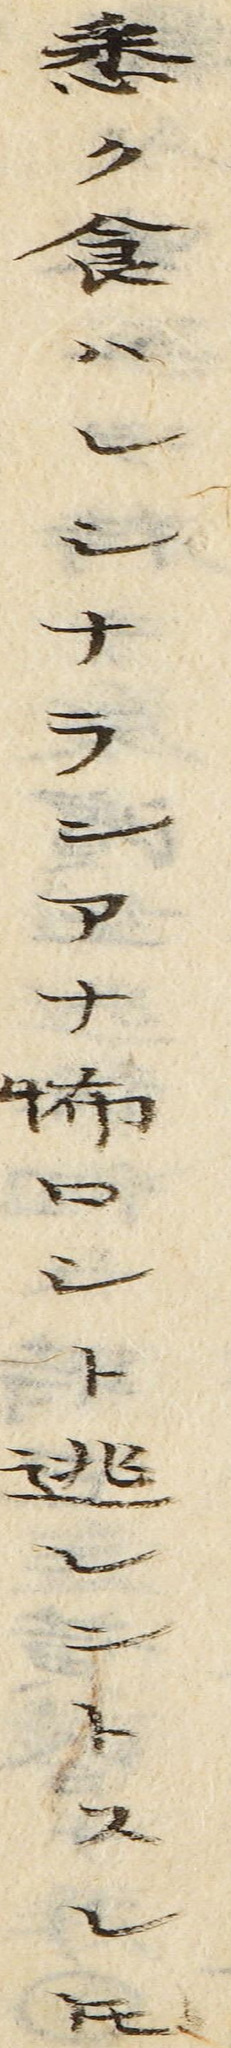悉ク食ハレシナランアナ怖ロシト逃レントスレトモ
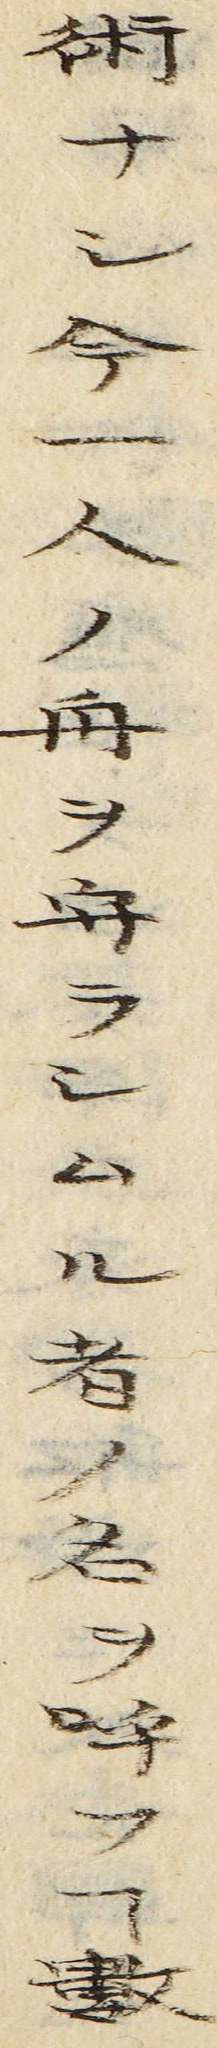術ナシ今一人ノ舟ヲ守ラシムル者ノ名ヲ呼フコト数

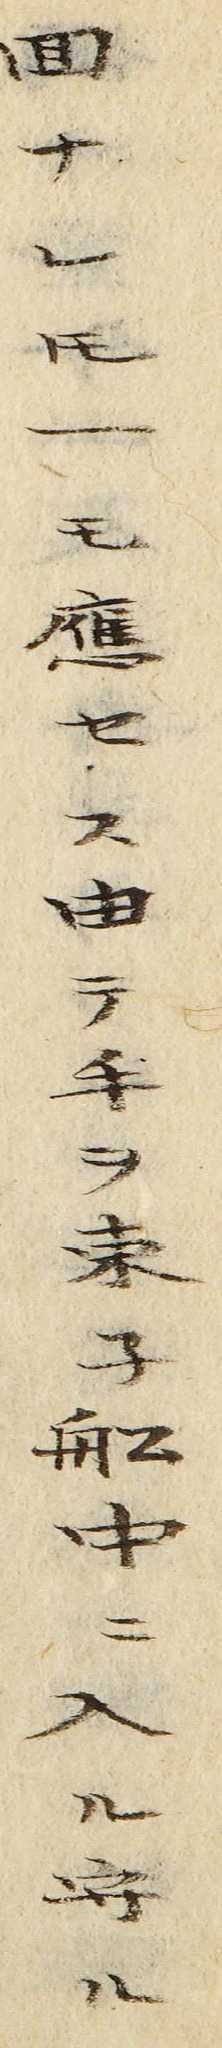回ナレトモ一モ応セス由テ手ヲ束ネ船中ニ入ル守ル
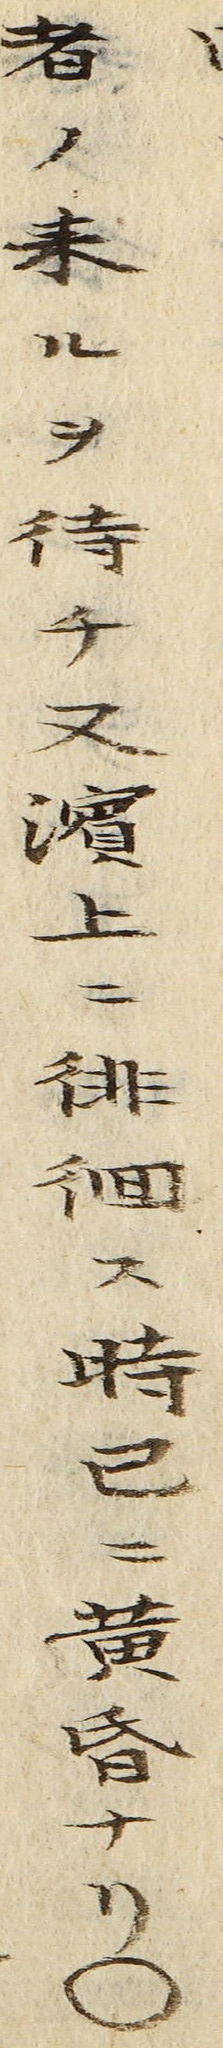者ノ来ルヲ待チ又浜上ニ徘徊ス時已ニ黄昏ナリ◯
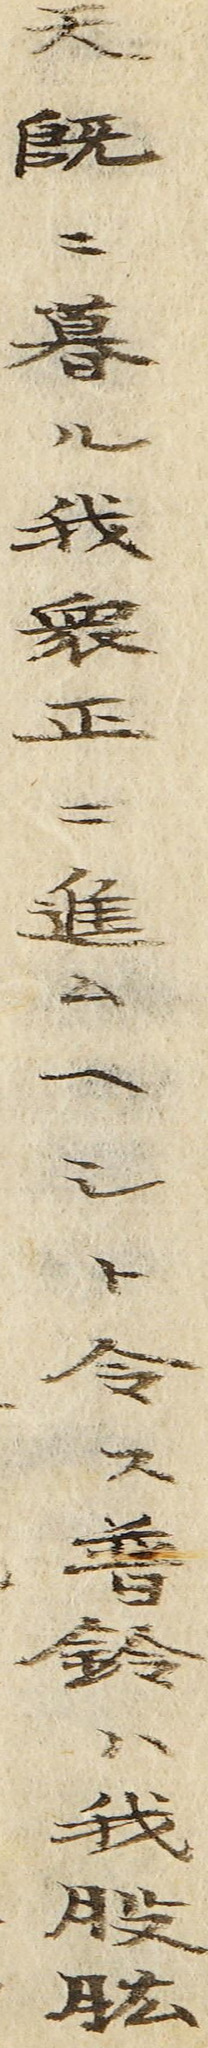天既ニ暮ル我衆正ニ進ムヘシト令ス普鈴ハ我股肱
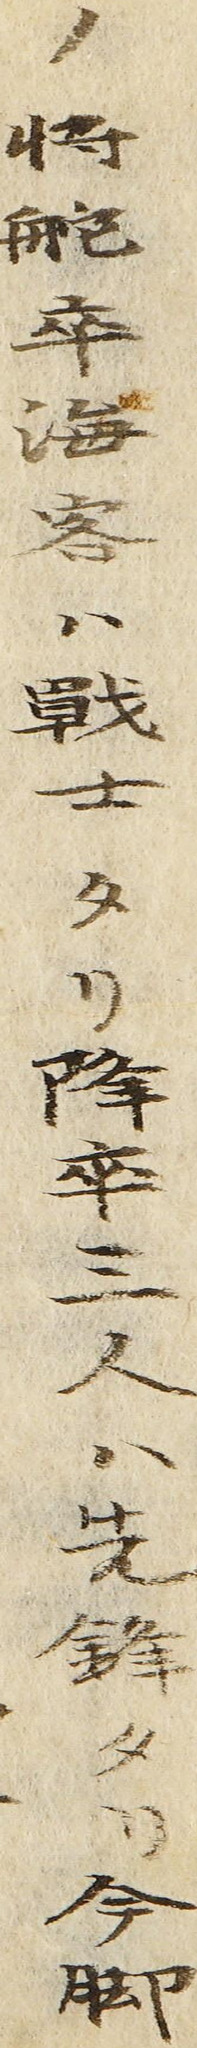ノ将舵卒海客ハ戦士タリ降卒三人ハ先鋒タリ今脚
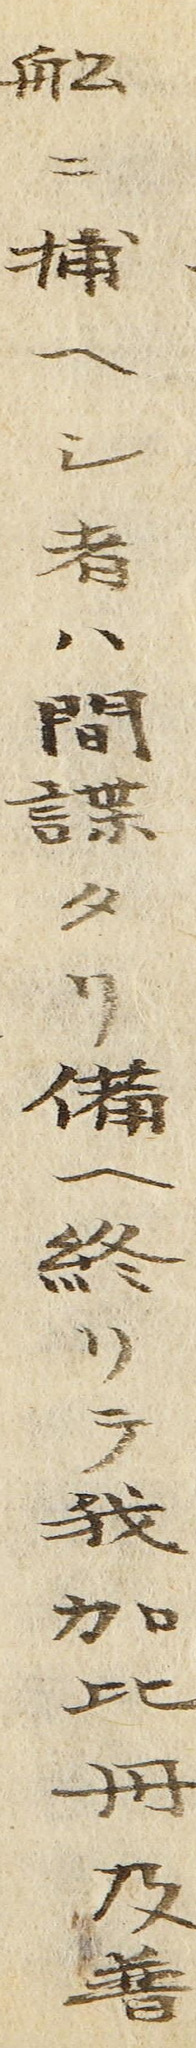船ニ捕ヘシ者ハ間謀タリ備ヘ終リテ我加比丹及普
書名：漂流紀事
